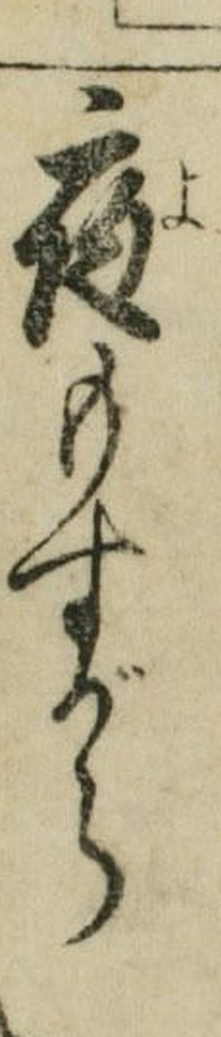夜もすがら
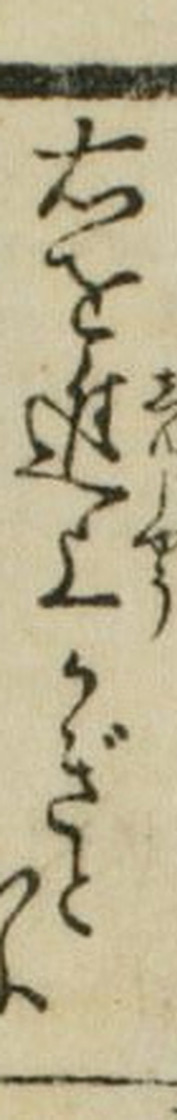右を進上かぎといふ
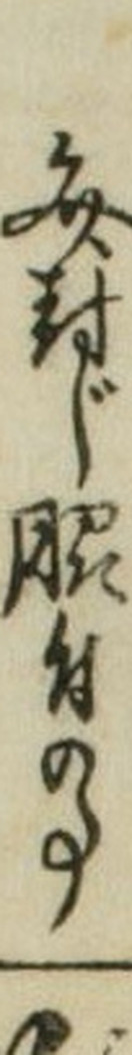文封じ脇付の事
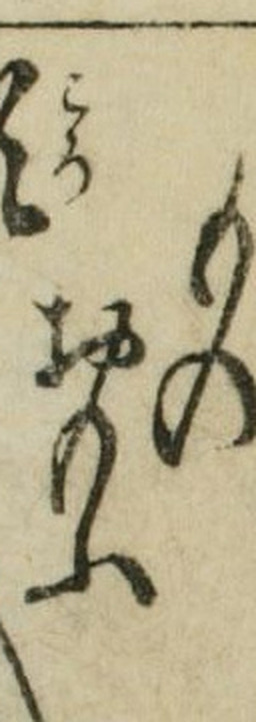おもふ
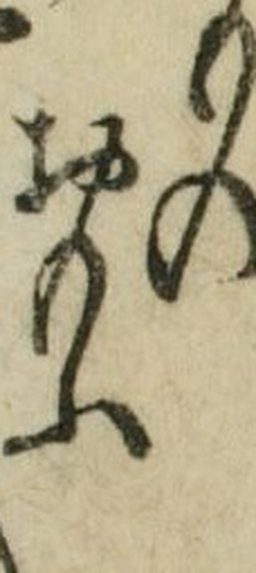おもふ
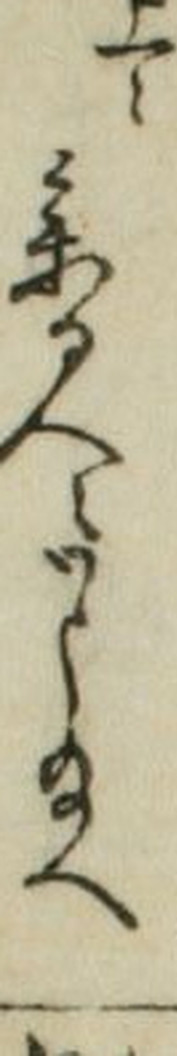まいる人々御申給へ
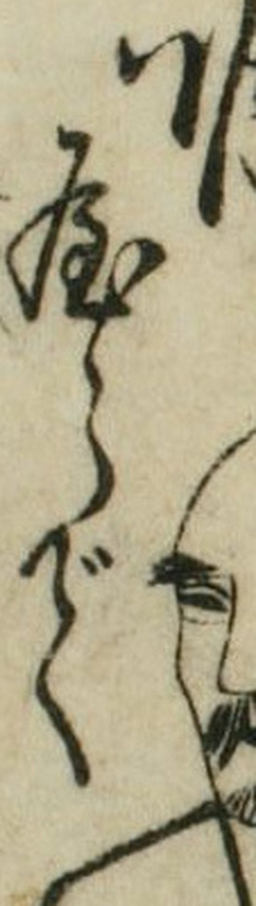やらで
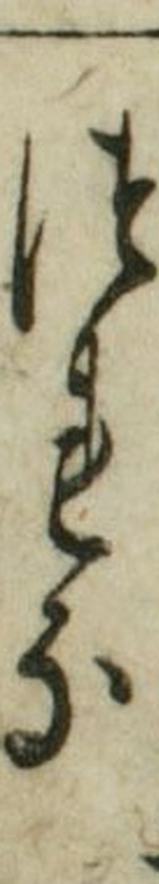つらな
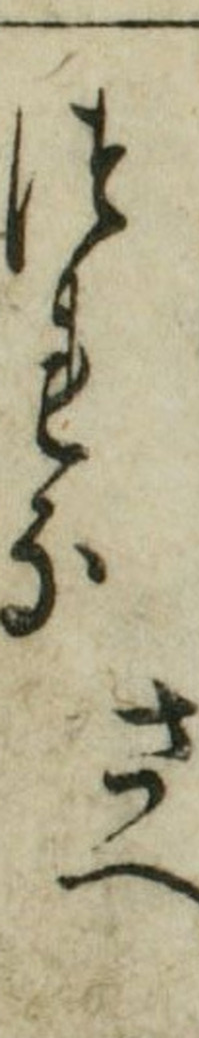つらな
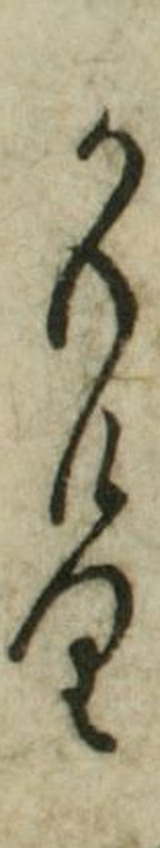かりけり

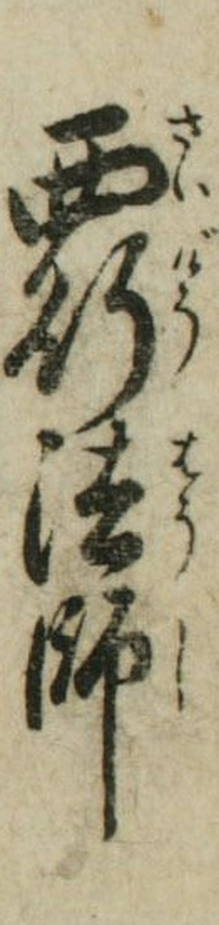西行法師
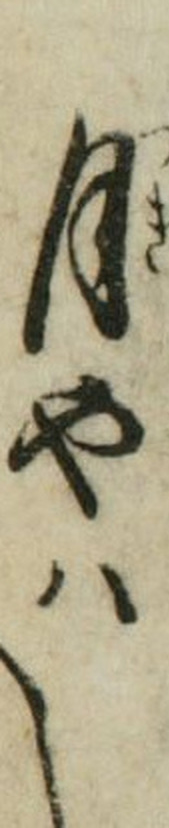月やは
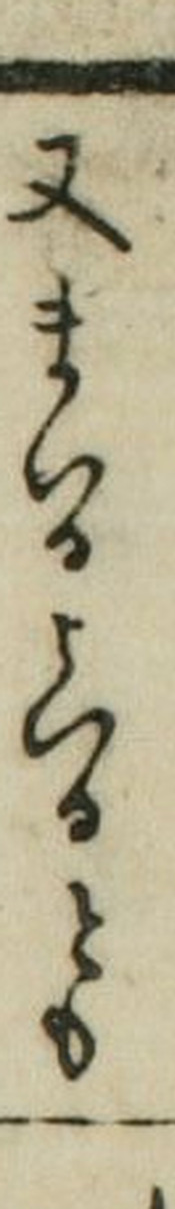又まいる上るとも
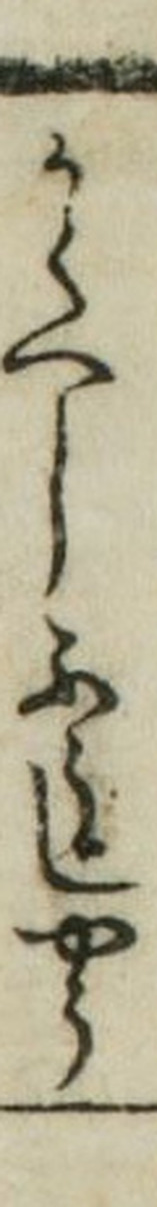かくへしふみしやう
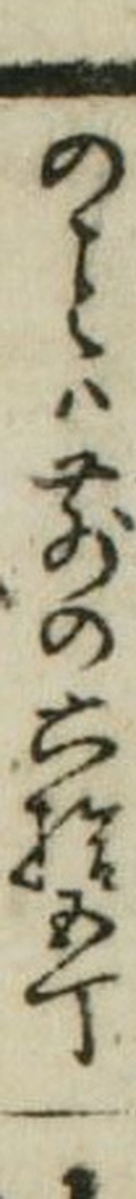のことは前の六拾五丁
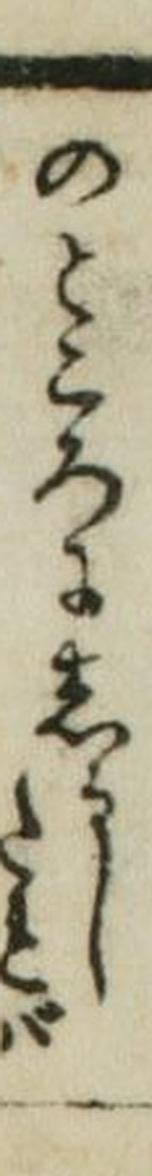のところにしるしことば
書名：百人一首
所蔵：東京学芸大学教育コンテンツアーカイブ
